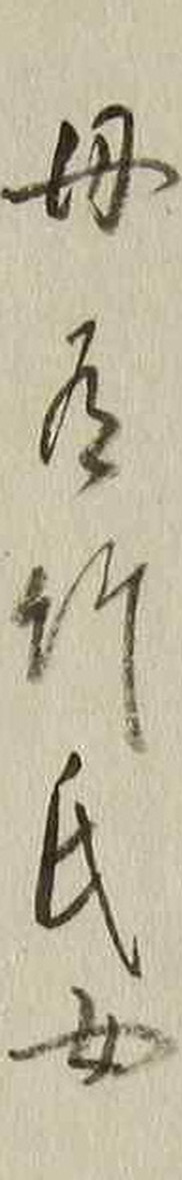母有竹氏女
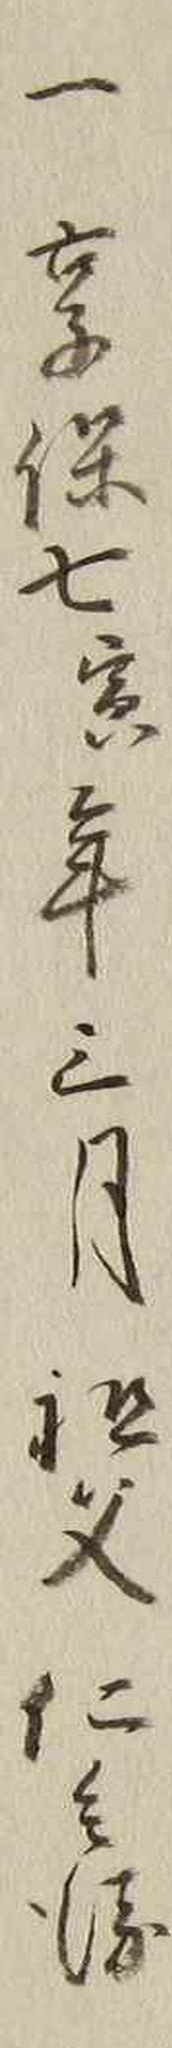一享保七寅年三月祖父仁兵衛
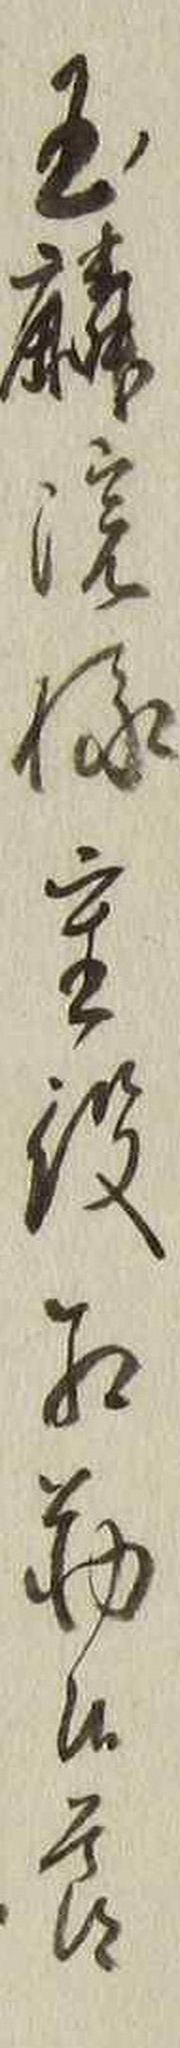玉麟院様重役相勤候節
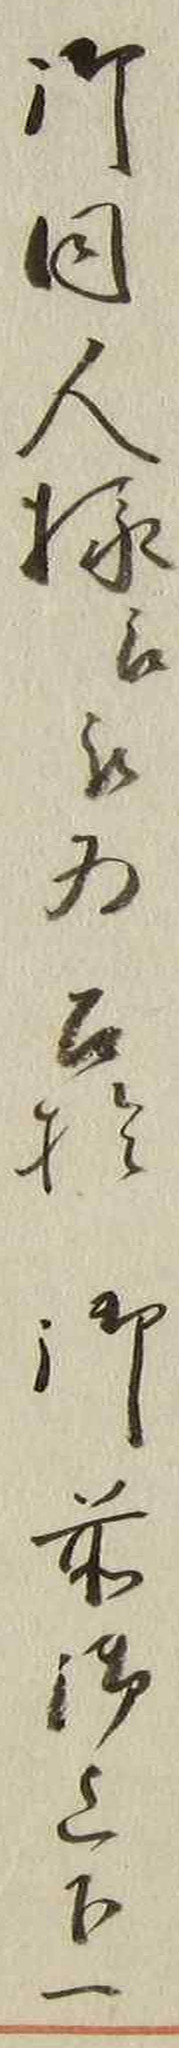御同人様江被為召捨御前御上下一
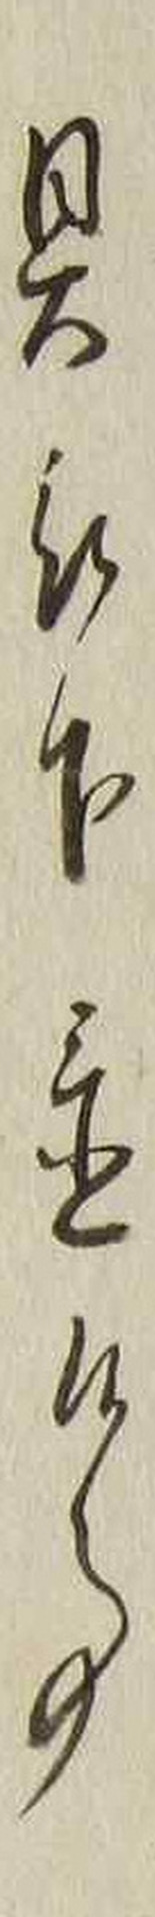具被下置候事
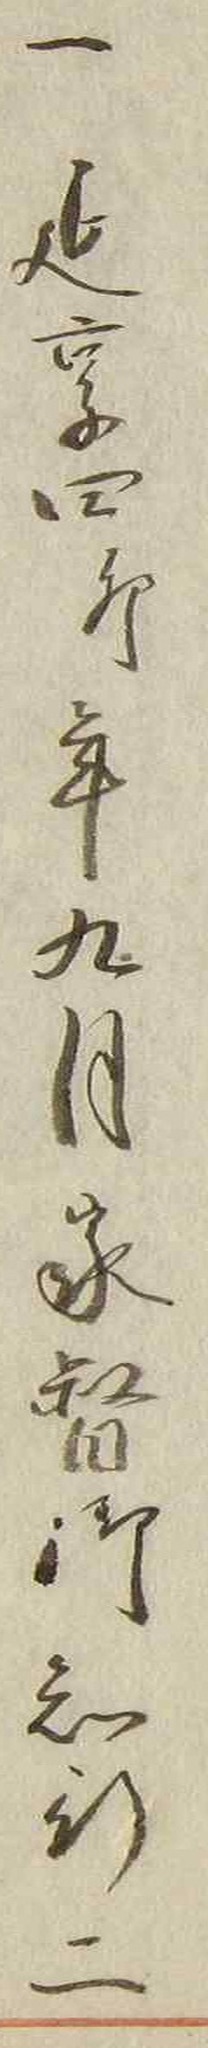一延享四卯年九月家督御知行二
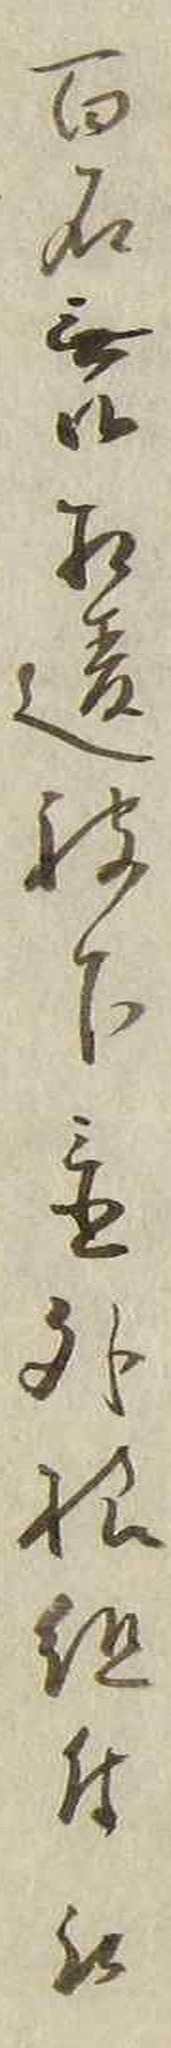百石無御相違被下置外様組付被

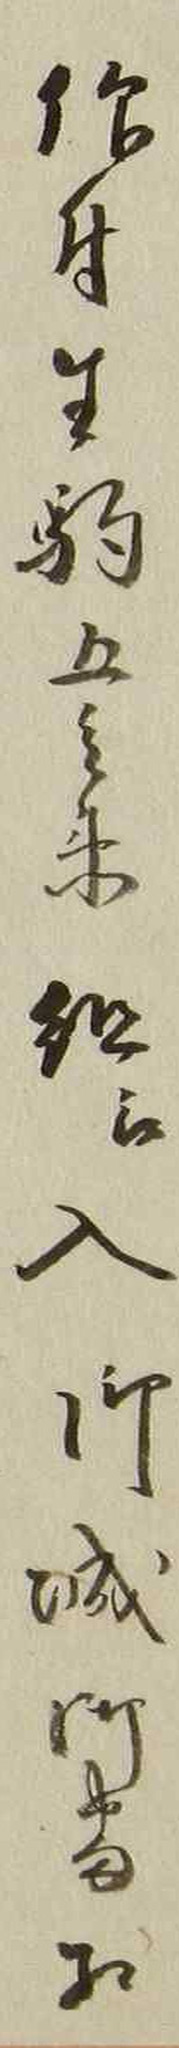仰付生駒五兵衛組江入御城御番相
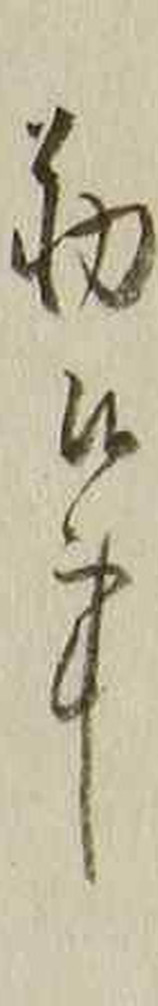勤候事
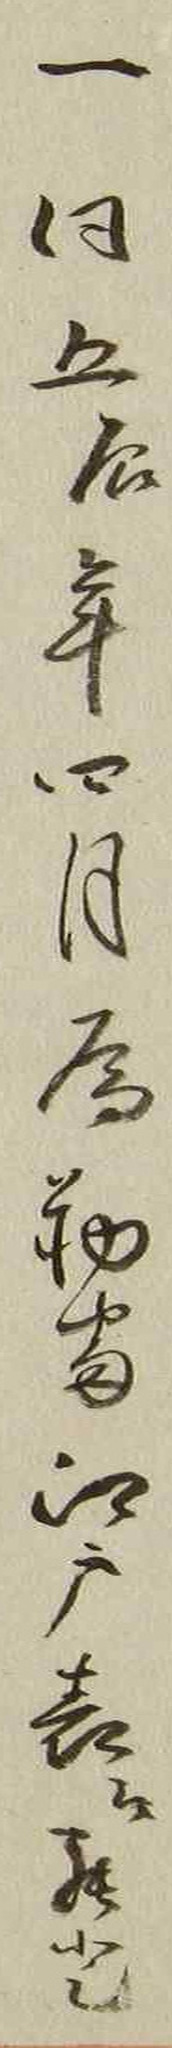一同五辰年四月為勤番江戸表江罷登
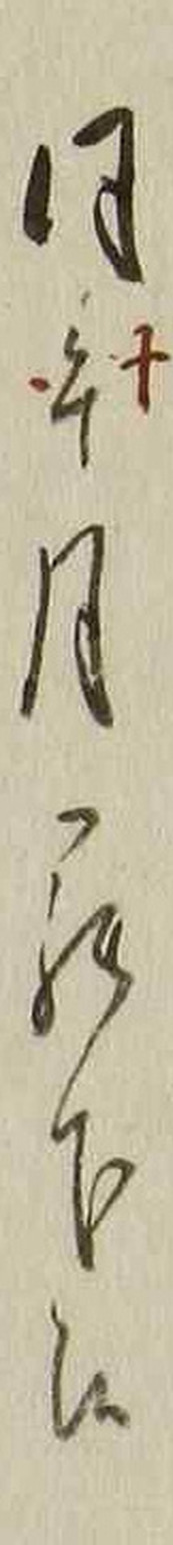十月罷下候事
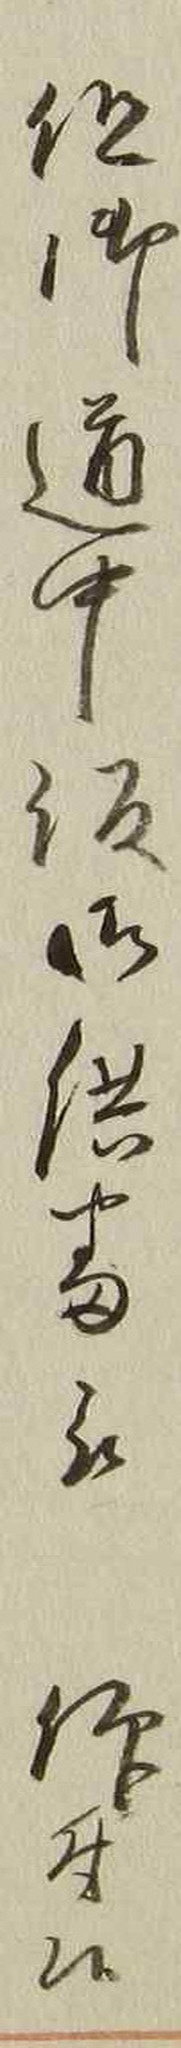但御道中仮御供番被仰付候
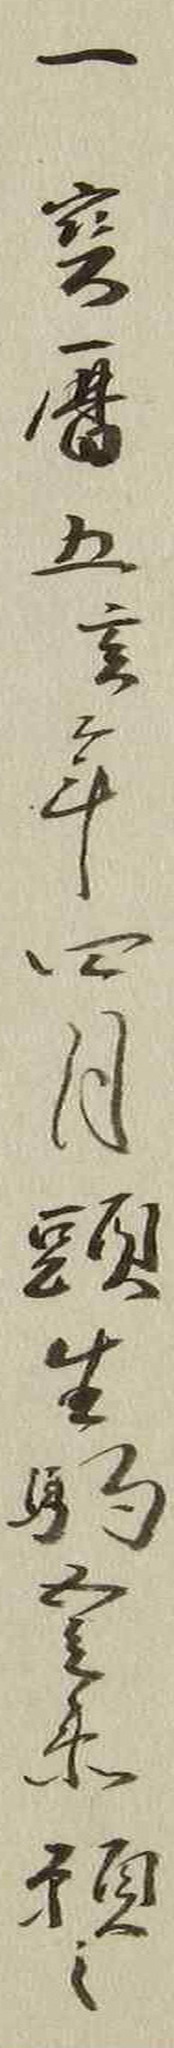一宝暦五亥年四月頭生駒五兵衛願之
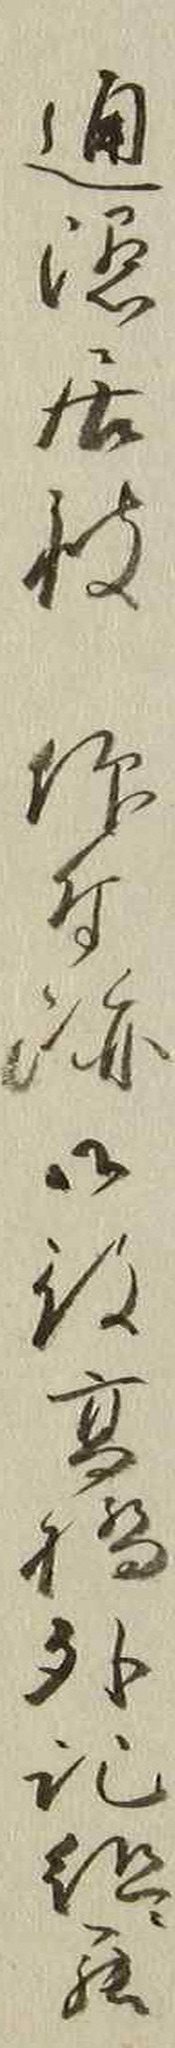通隠居被仰付跡御役高橋外記組ニ罷
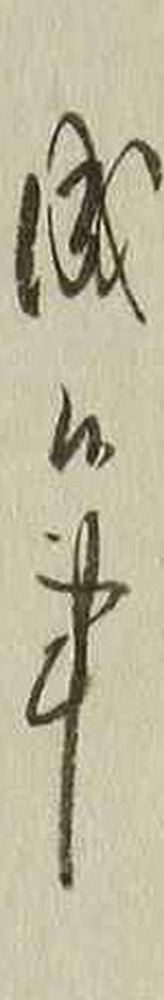成候事
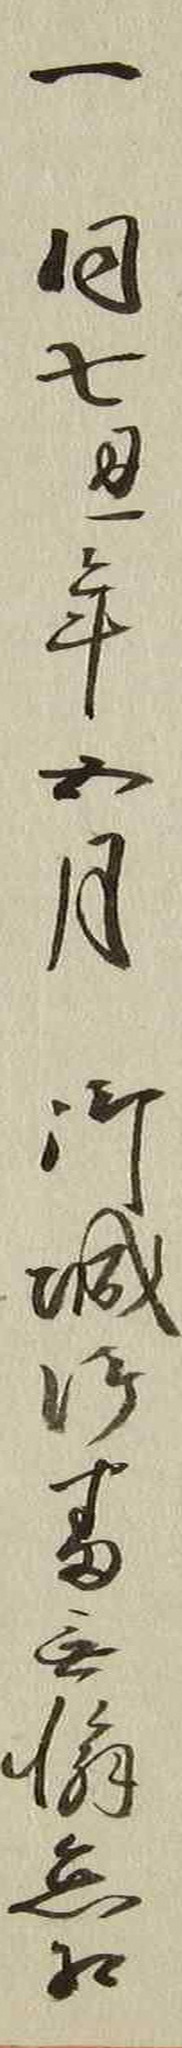一同七丑年五月御城御番無懈怠相
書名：諸士系譜　巻之122　よ之部5
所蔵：会津若松市立会津図書館
